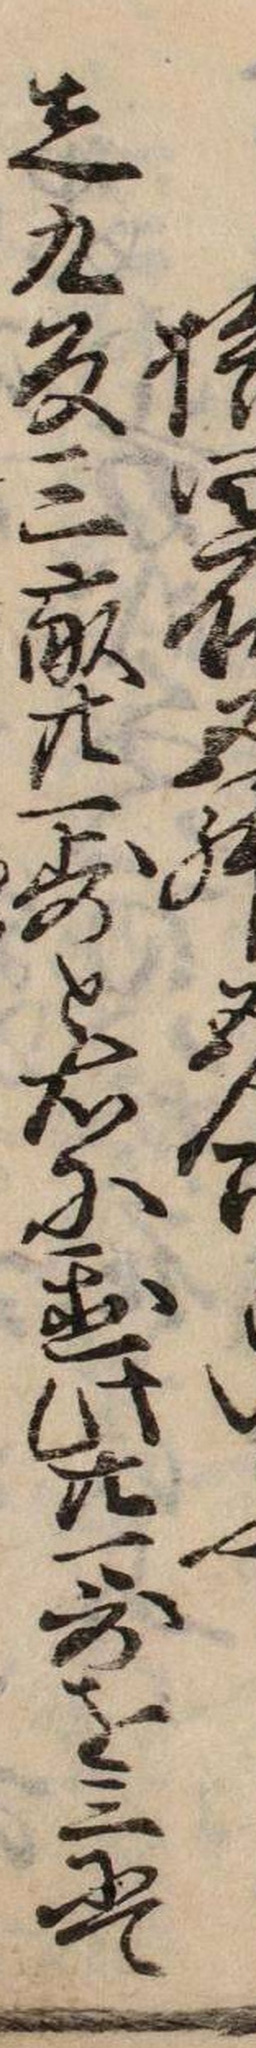先九反三畝廿一歩と右に置此廿一歩を三にて
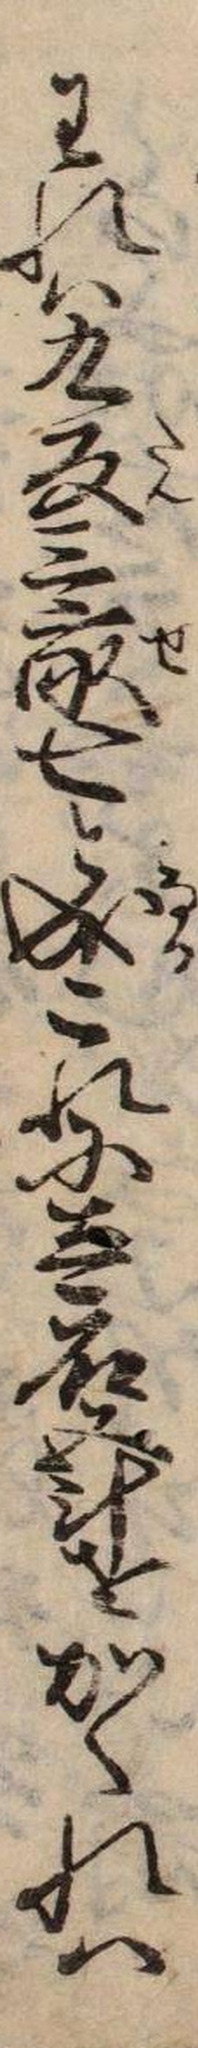われは九反三畝七と成これに壱石五斗をかくれは
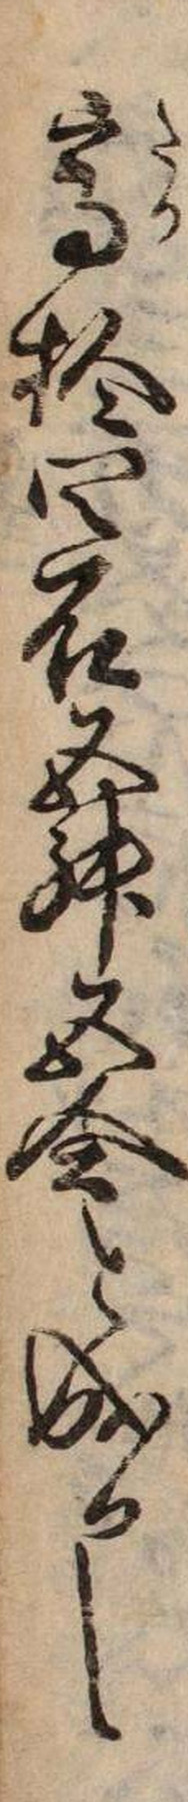高拾四石五舛五合と成申候

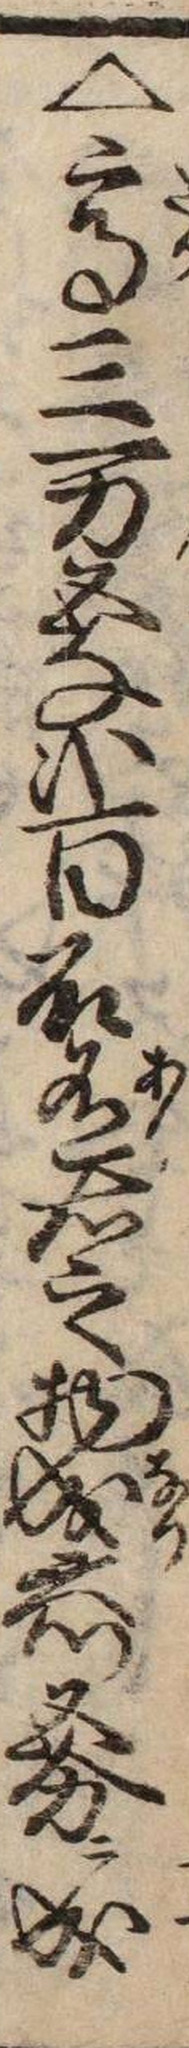△高三万五千弐百石有右の物成六つ五分に成
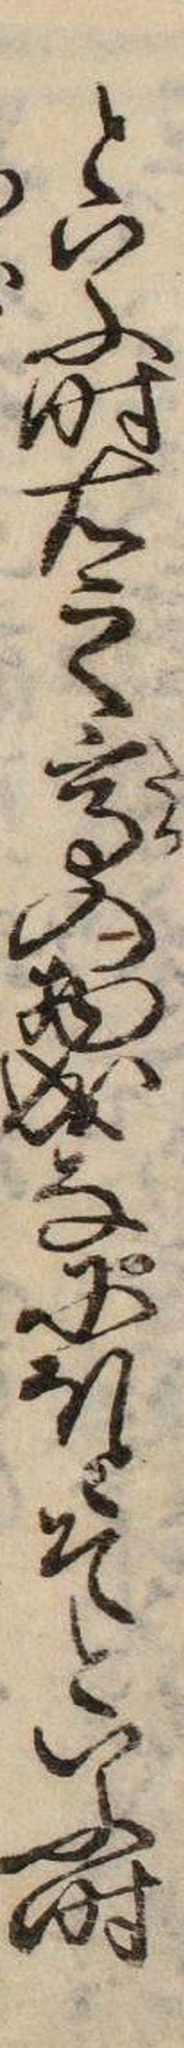といふ時右の高の物成なにほとそといふ時
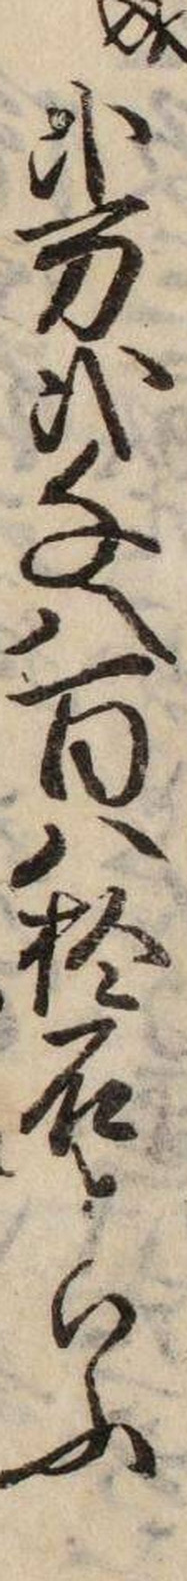物成弐万弐千八百八拾石といふ
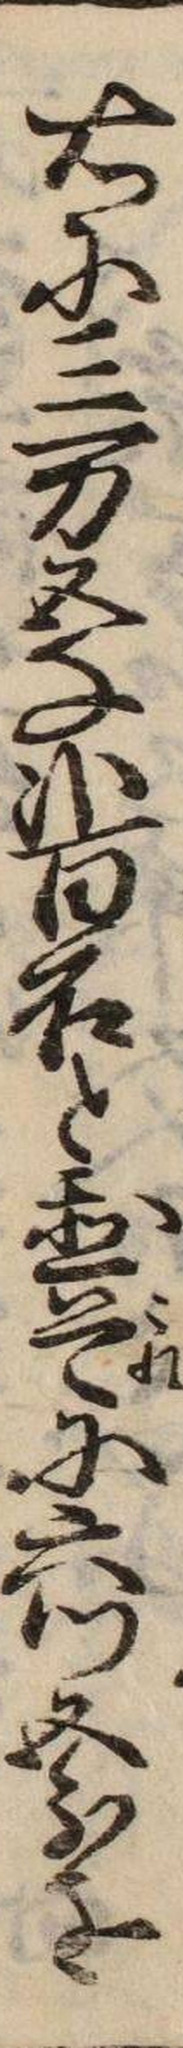右に三万五千弐百石と置是に六つ五分を
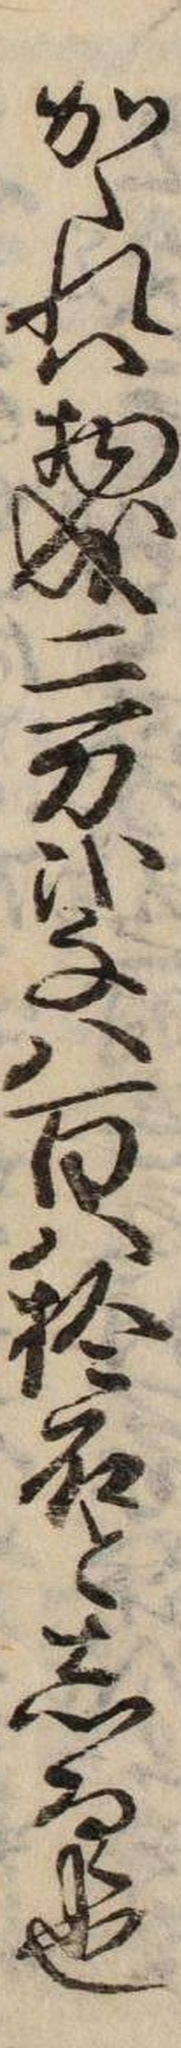かくれは物成二万弐千八百八拾石としるゝ也
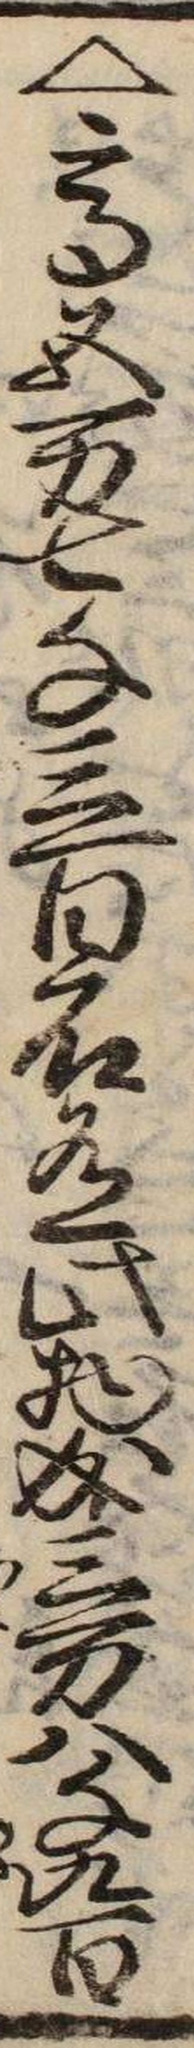△高五万七千三百石有此物成三万八千九百
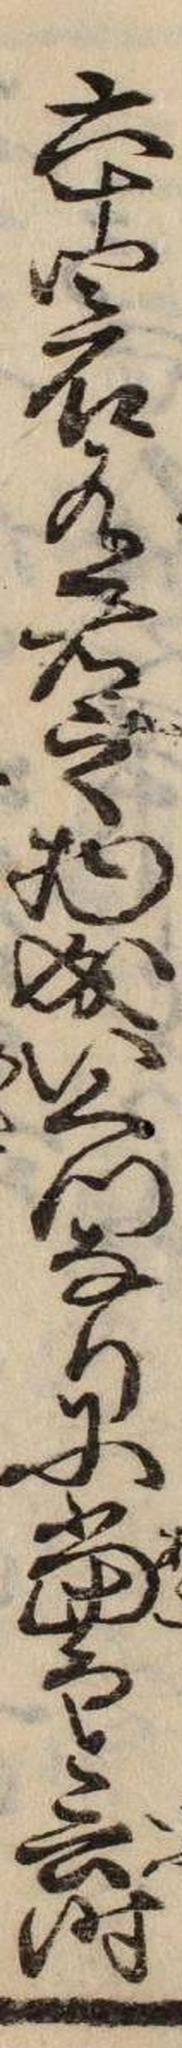六十四石有右の物成いくつなりに当ると云時
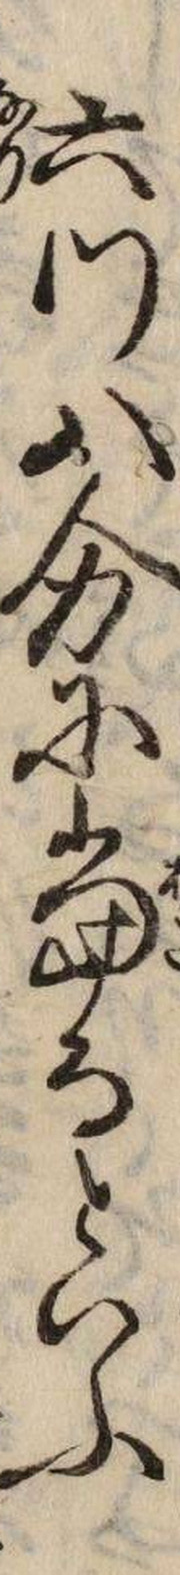六つ八分に当るといふ
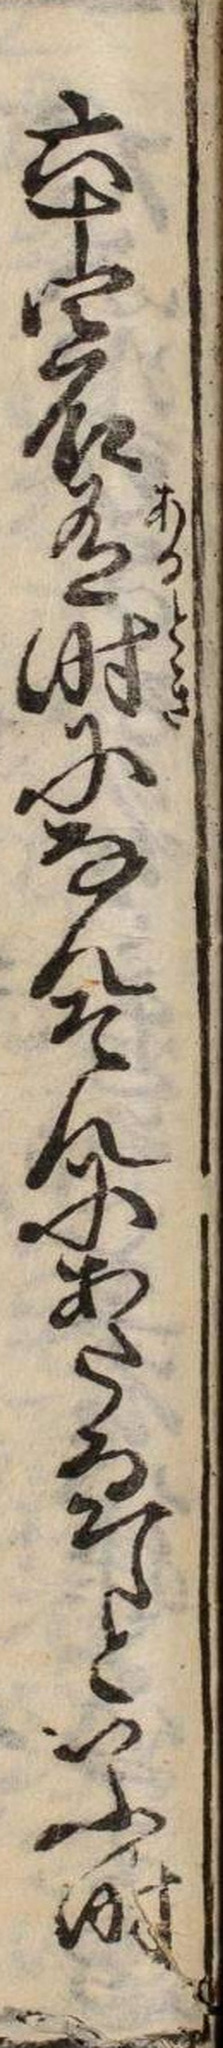六十四石有時になんそんにあたるそといふ時
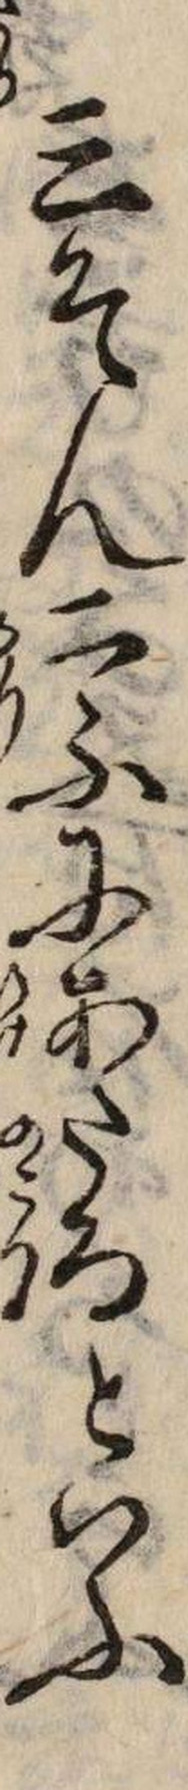三そん二ふにあたるといふ
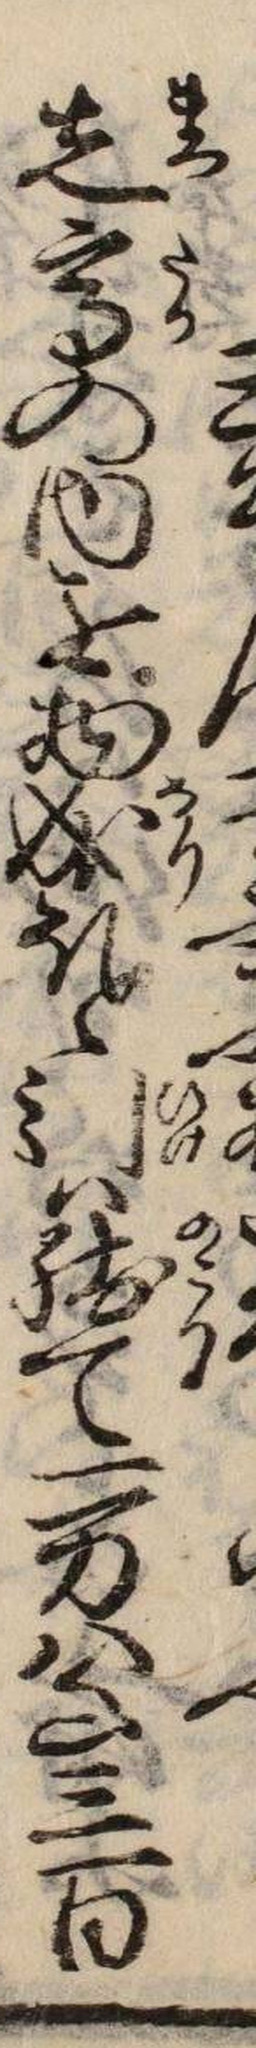先高の内を物成ほと引は残て一万八千三百
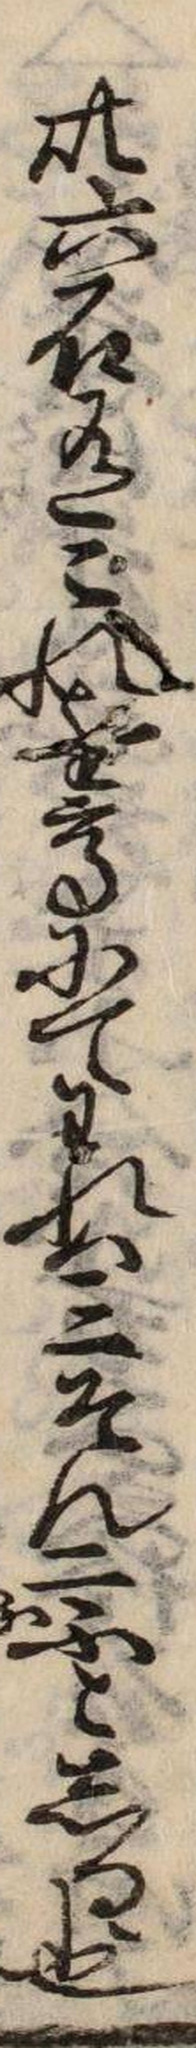卅六石有これを高にてわれは三そん二ふとしるゝ也
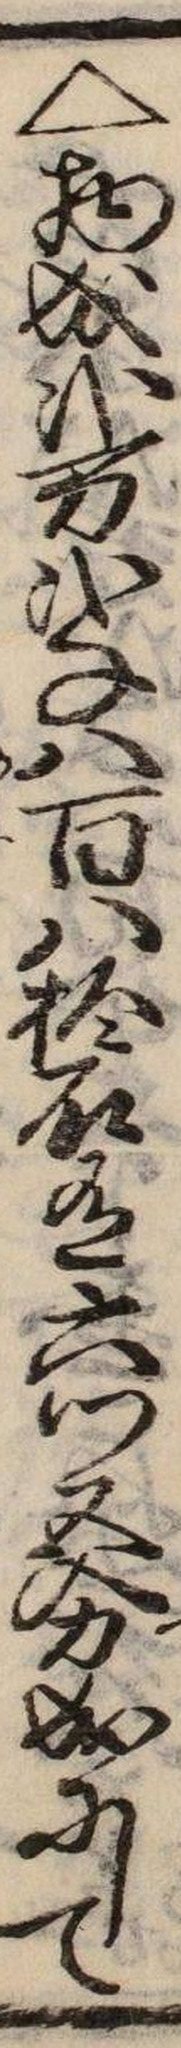△物成弐万弐千八百八拾石有六つ五分成にして
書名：塵劫記（寛永11年自跋、京都府立京都学・歴彩館追貴8）
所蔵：京都府立京都学・歴彩館 国文学研究資料館
